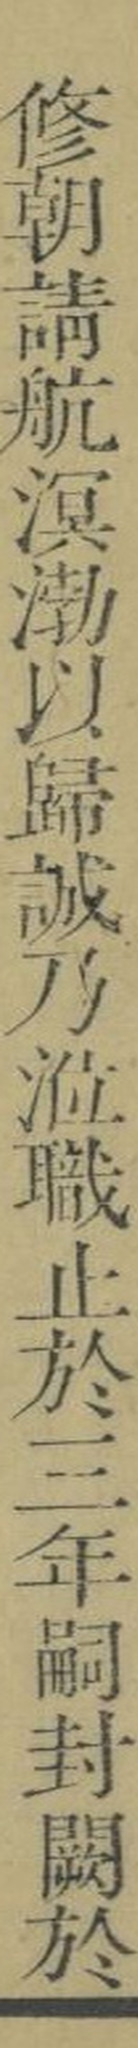修朝請航溟渤以歸誠乃涖職止於三年嗣封闕於
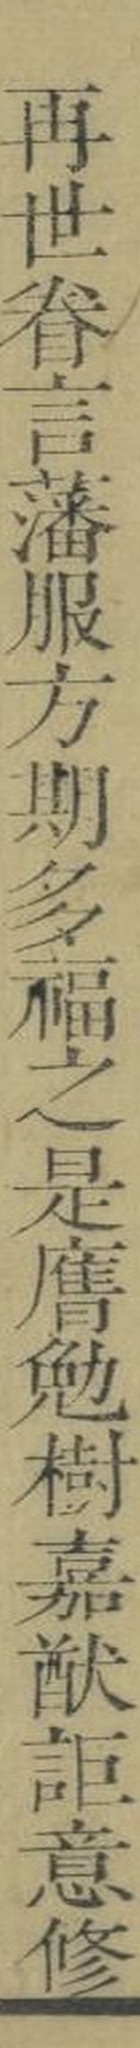再世眷言藩服方期多福之是膺勉樹嘉猷詎意修
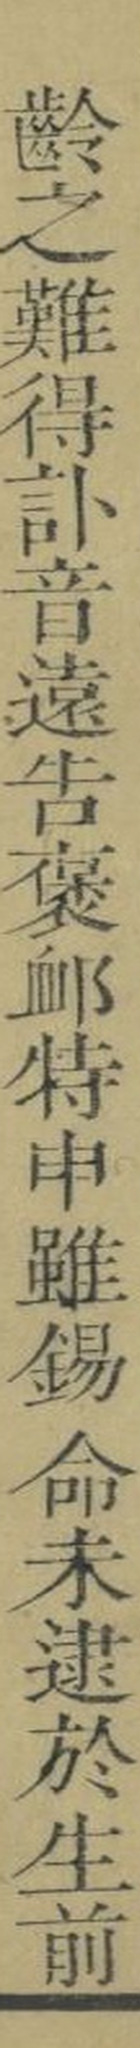齡之難得訃音遠告褒䘏特申雖錫命未逮於生前
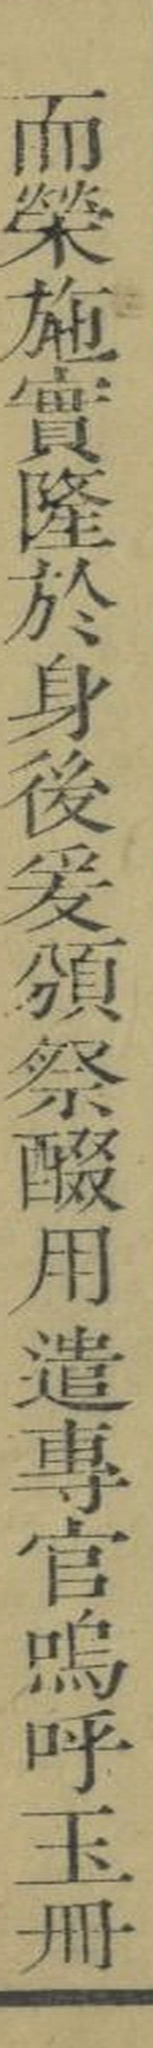而榮施實隆於身後爰頒祭醊用遣專官嗚呼玉冊
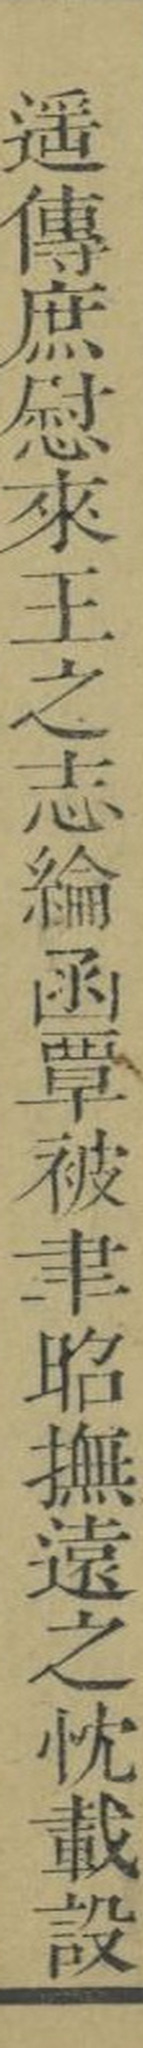遥傳庶慰來王之志綸函覃被聿昭撫遠之忱載設

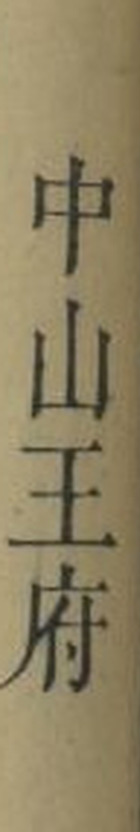中山王府
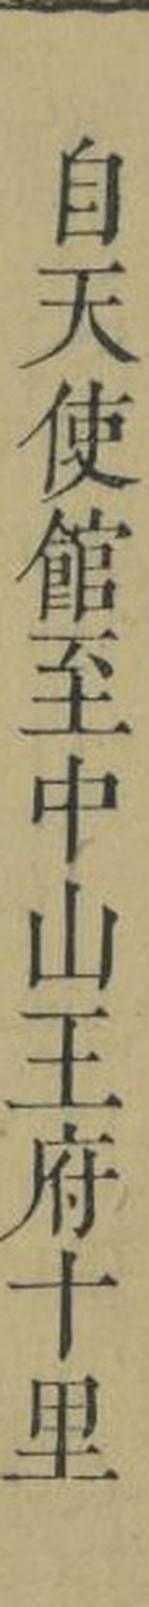自天使館至中山王府十里
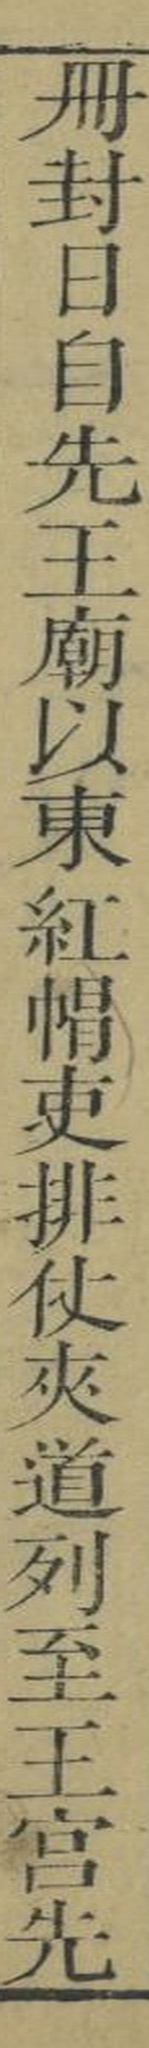冊封日自先王廟以東紅帽吏排仗夾道列至王宫先
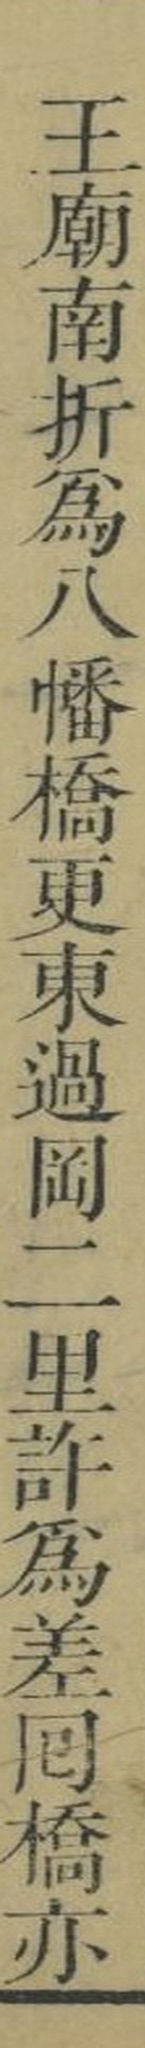王廟南折爲八幡橋更東過岡二里許爲差囘橋亦
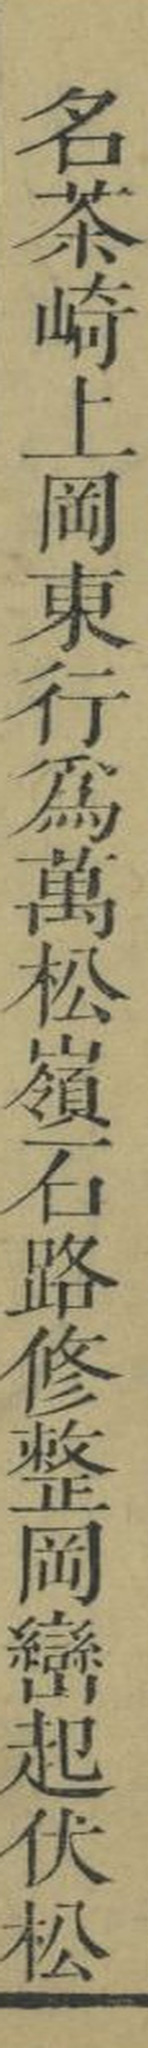名茶崎上岡東行爲萬松嶺石路修整岡巒起伏松
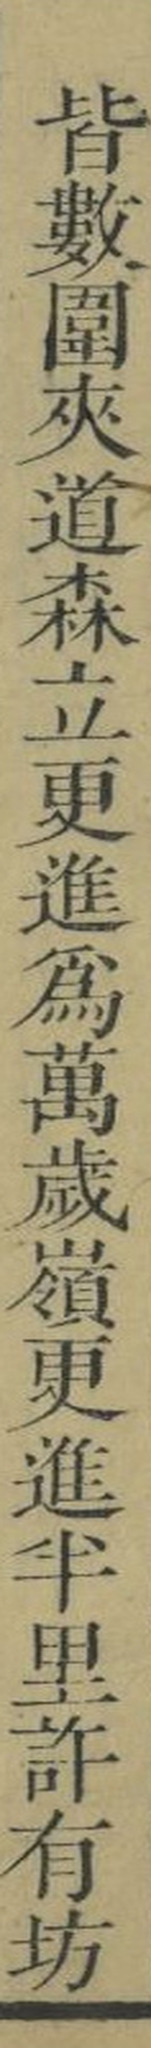皆數圍夾道森立更進爲萬歲嶺更進半里許有坊
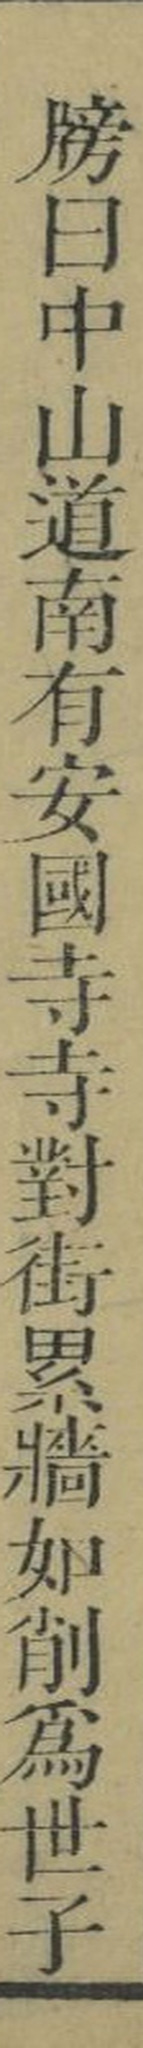牓曰中山道南有安國寺寺對街累牆如削爲世子
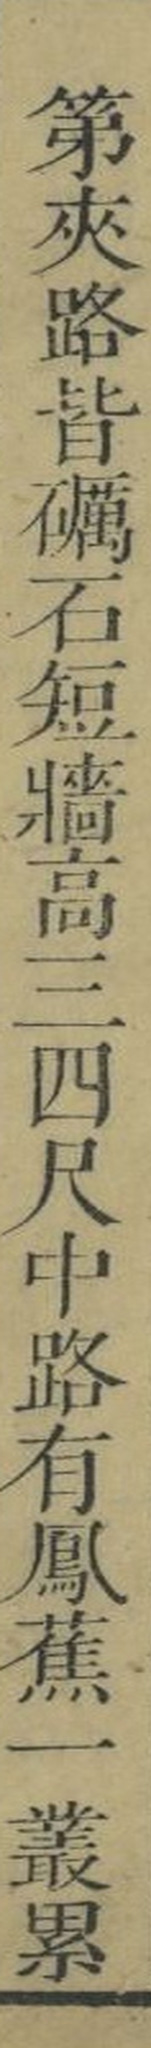第夾路皆礪石短牆高三四尺中路有鳳蕉一叢累
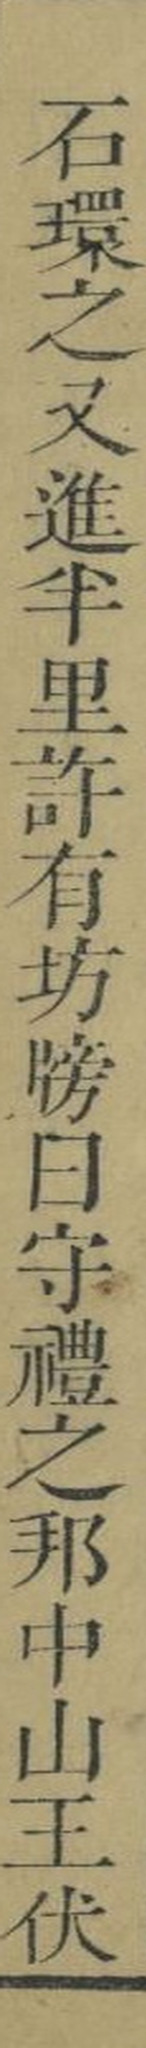石環之又進半里許有坊牓曰守禮之邦中山王伏

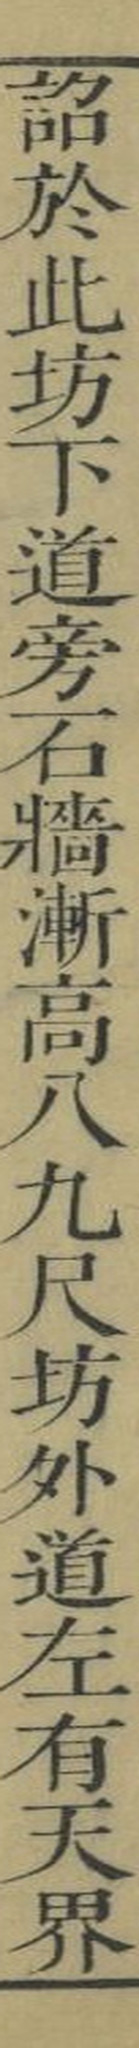詔於此坊下道旁石牆漸高八九尺坊外道左有天界
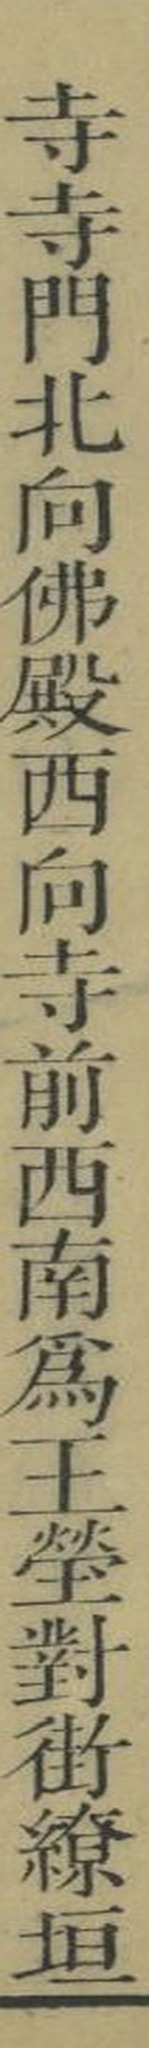寺寺門北向佛殿西向寺前西南爲王塋對街繚垣
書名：中山伝信録 巻二
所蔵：University of the Ryukyus Library
